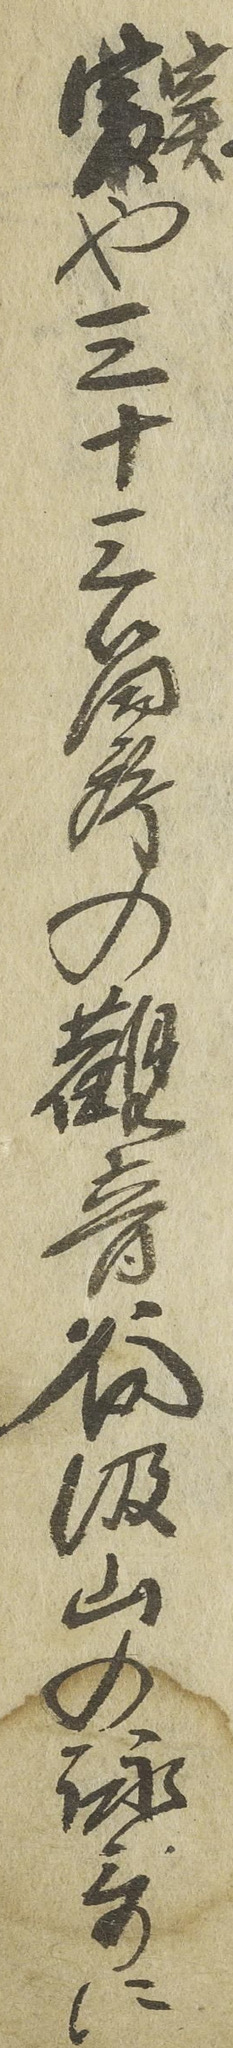実也三十三箇所の観音谷汲山の詠哥に

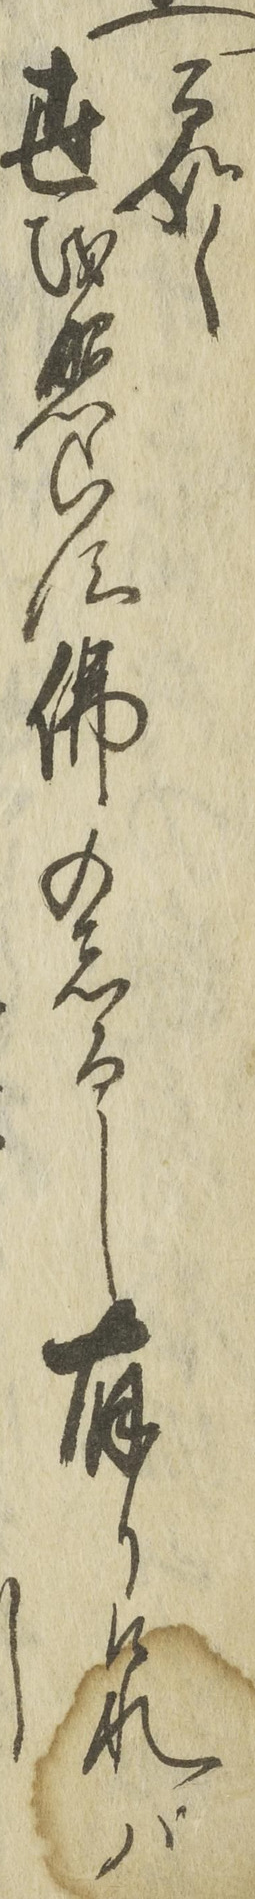世を照らす仏のしるし有りければ
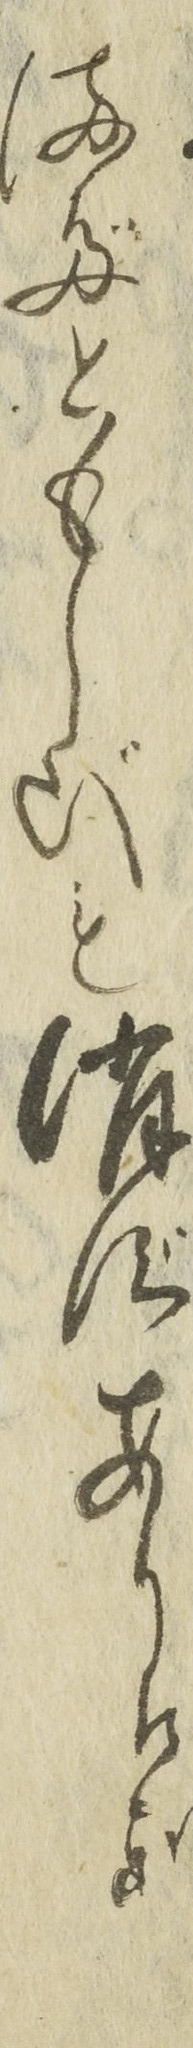まだともしびも消ずありけり
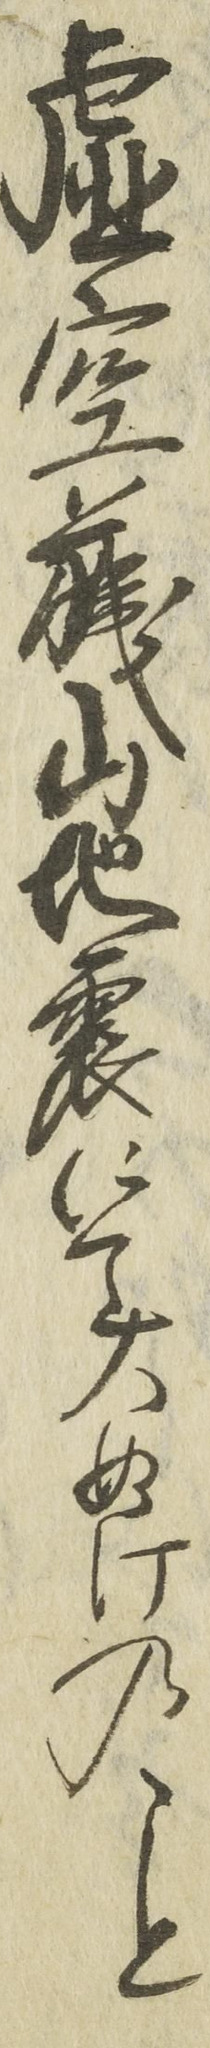虚空蔵山地震にて大ぬけのこと
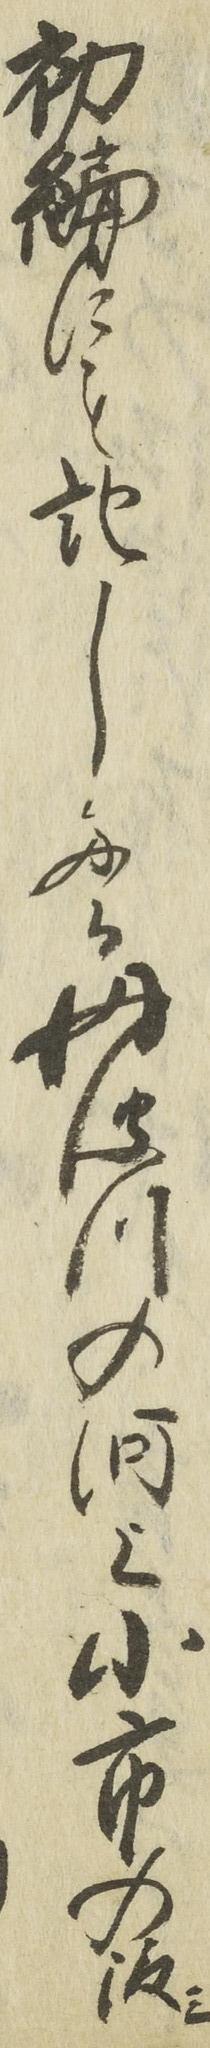初編にも記したる丹波川の河上小市の渡シ
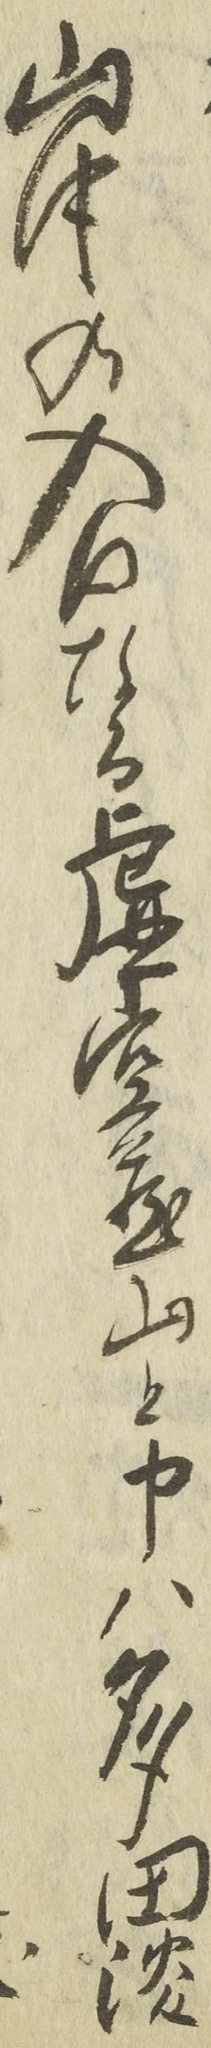山中の入口なる虚空蔵山と申は多田淡
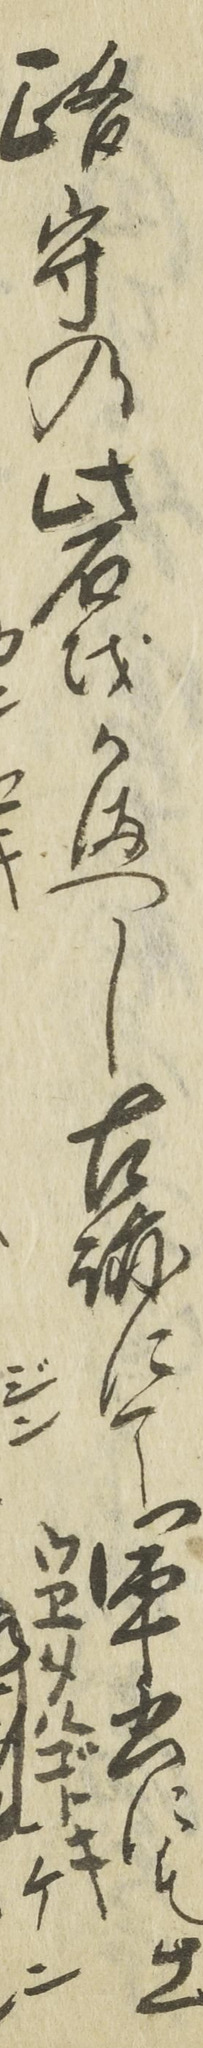路守の砦をかまへし古跡にて軍書にも出
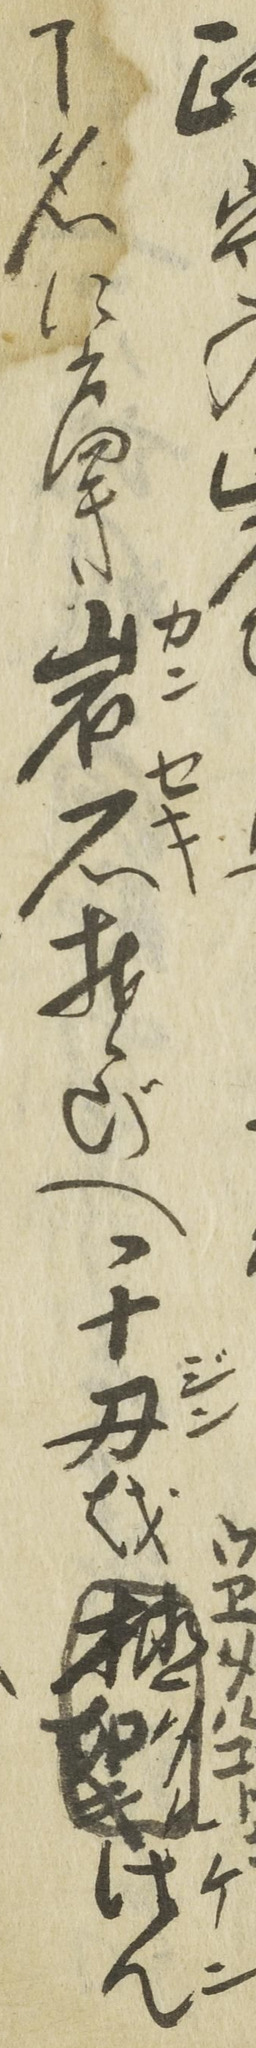て名に高き岩石そびへ千刃を植タル如キけん
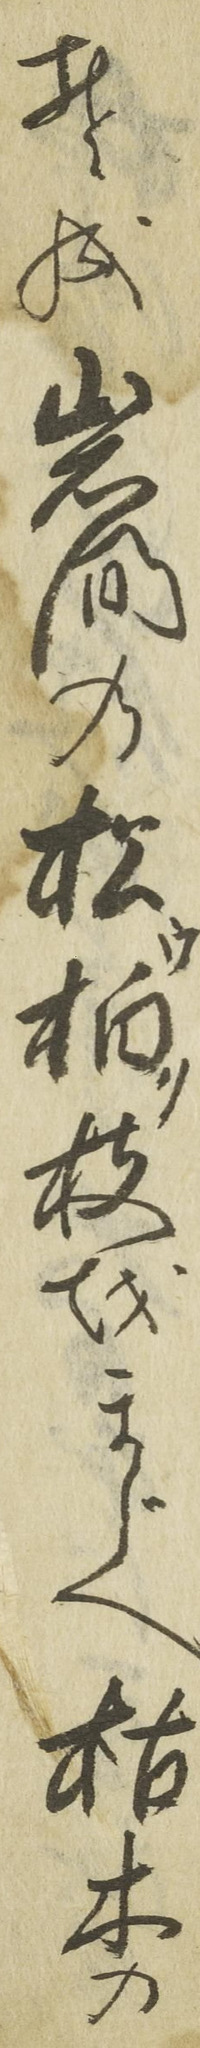そ成岩間の松ウ柏ク枝をまじへ枯木の
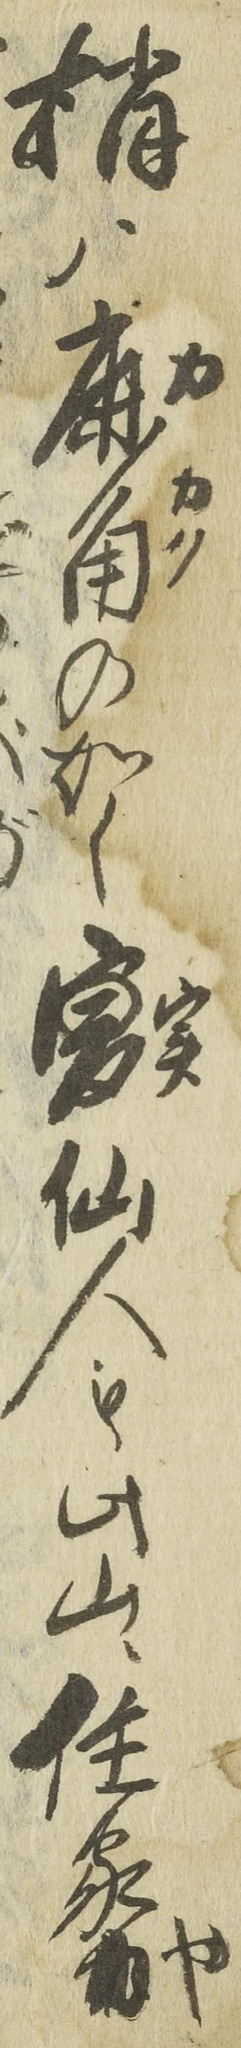梢は鹿角の如く実仙人も此山へ住家や
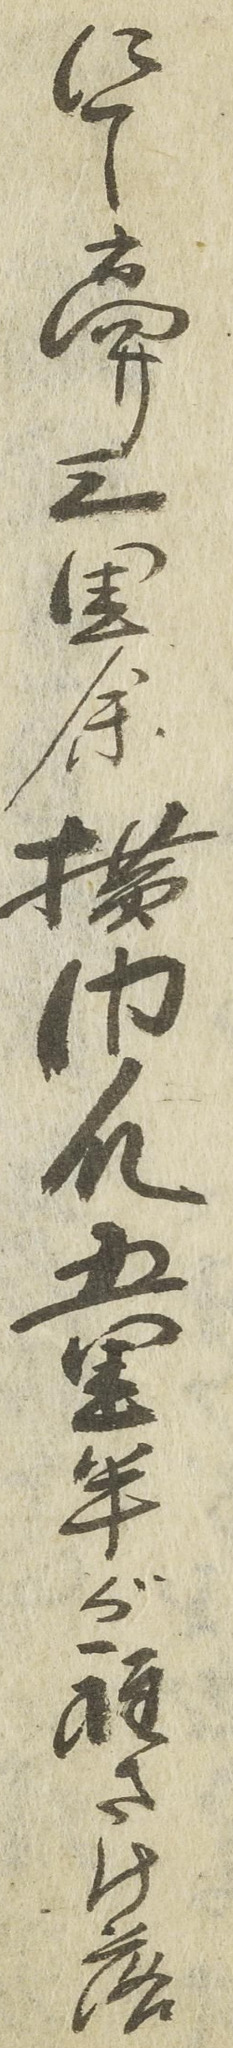にて高サ三里余横巾凡五里半が程さけ落
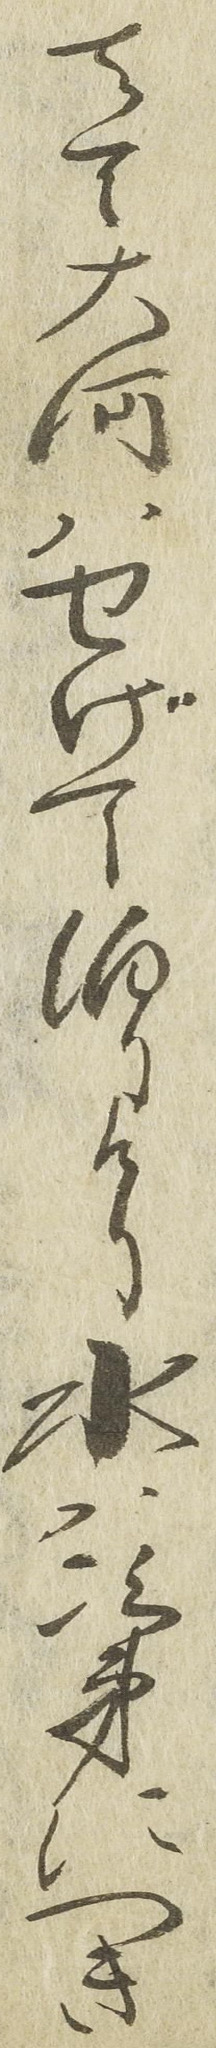ちて大河はせげて泊りけり水は次第につき
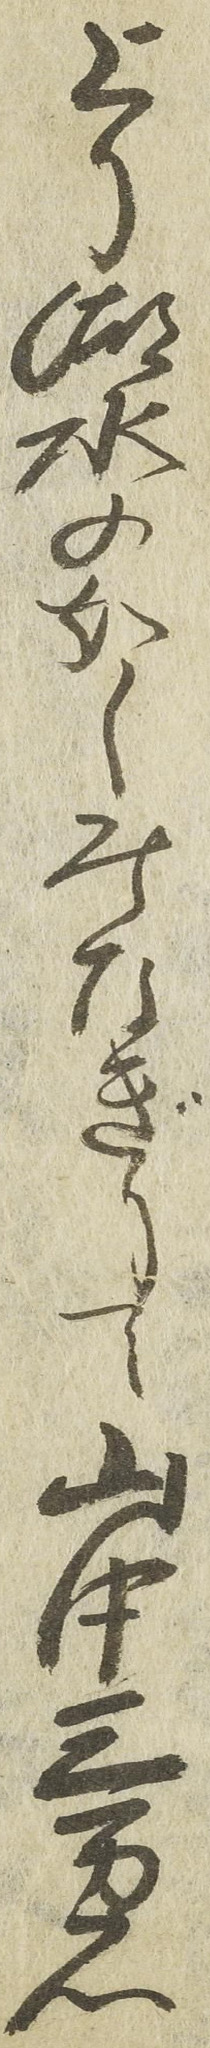上り湖水の如くみなぎりて山中三万石
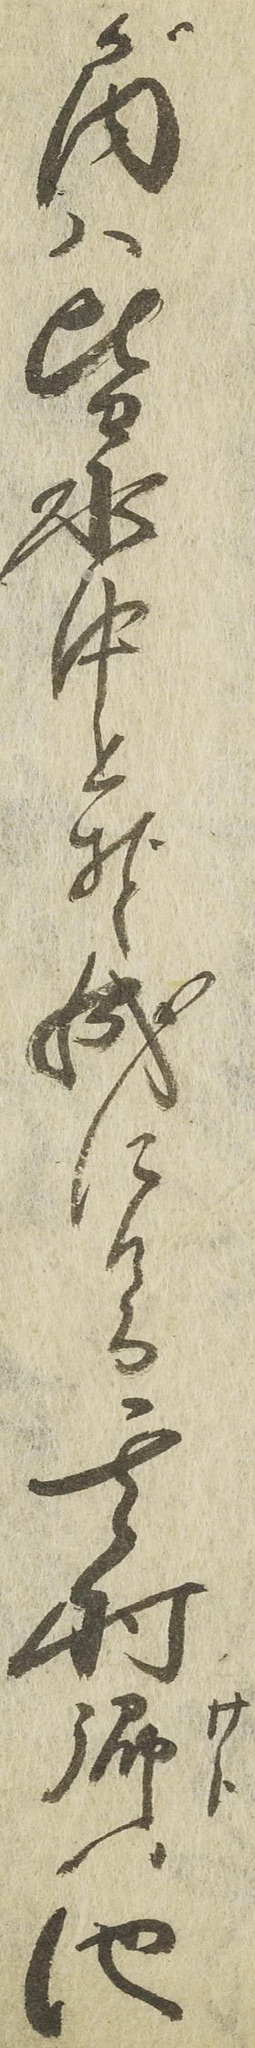が内は皆水中とそ成にける其村郷は池
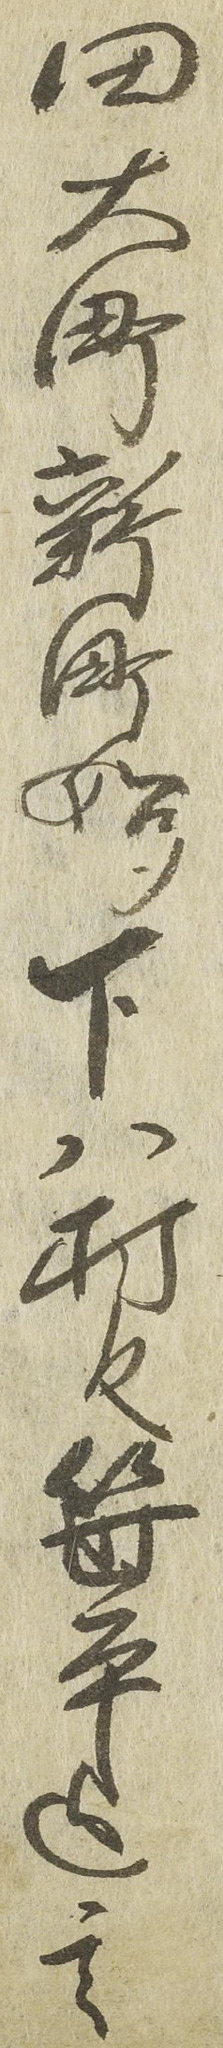田大町新町始メ下は村々笹平迄其
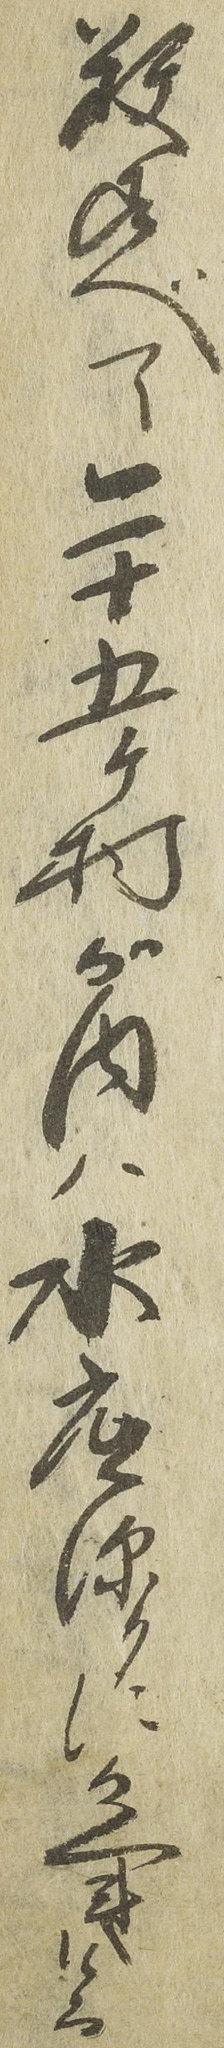数すべて二十五ヶ村が内は水底深クにかくれける
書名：善光寺地震聞書
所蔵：東京大学地震研究所図書室 Earthquake Research Institute Library, The University of Tokyo, JAPAN
